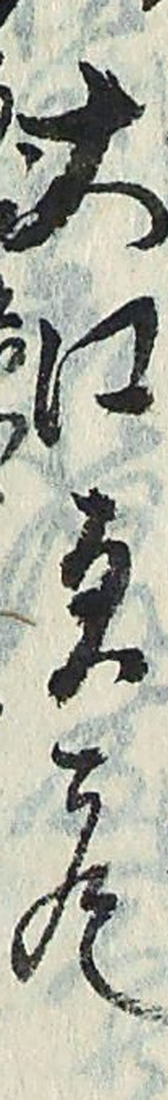大江真蔵
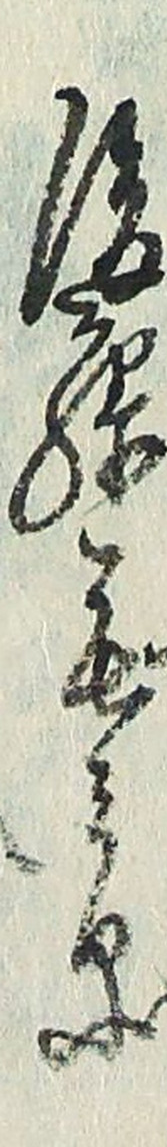後藤善兵衛

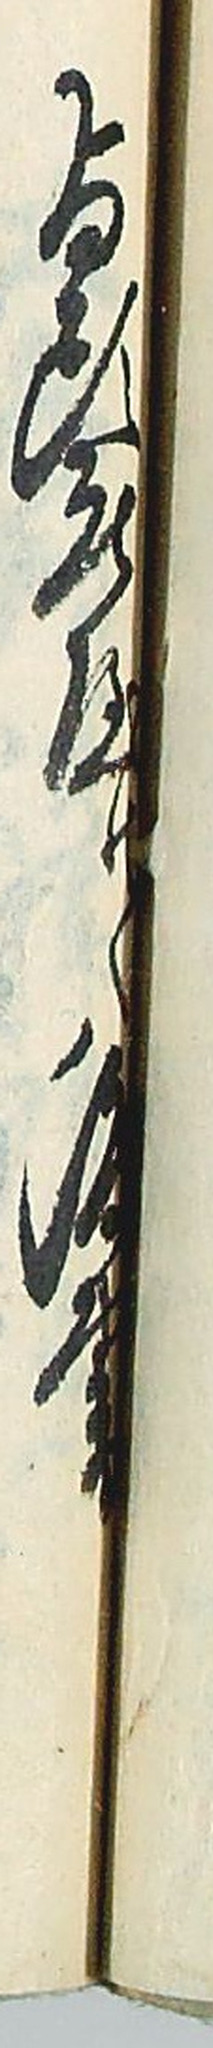与頭庄屋共へ渡書
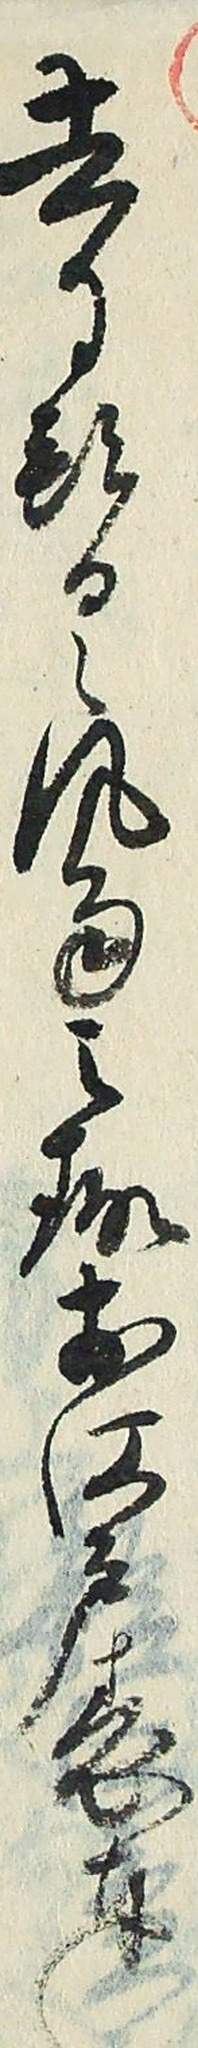去月朔日之風雨之趣於江戸表達
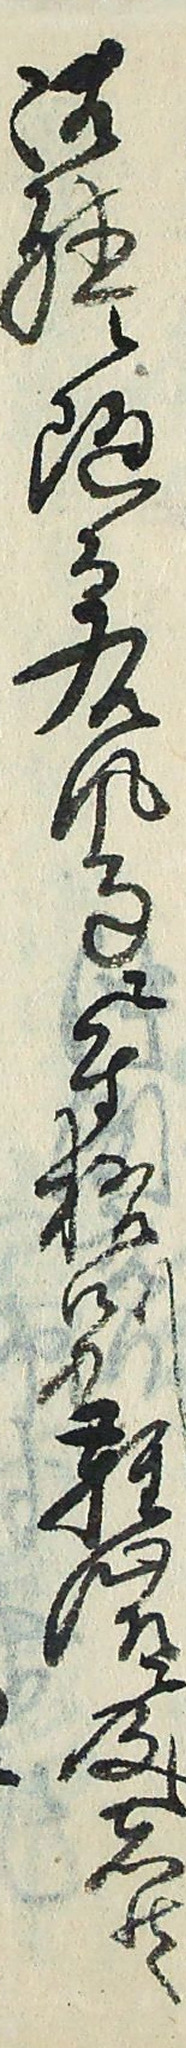御聴候随而右風雨ニ付格別難渋ニ及候者共
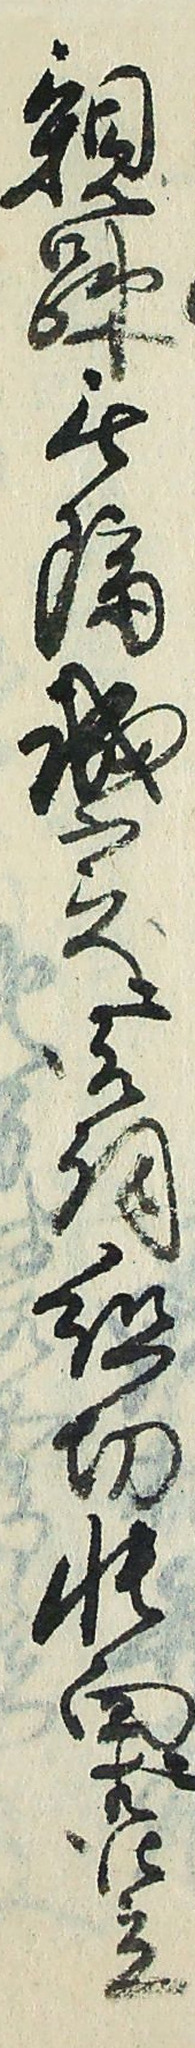親疎無隔誠実ニ取調組切帳面ニ相仕立
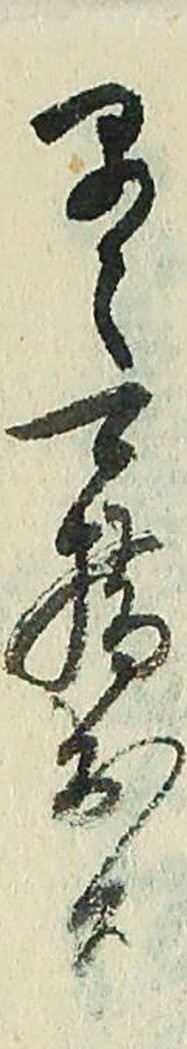早々可指出候
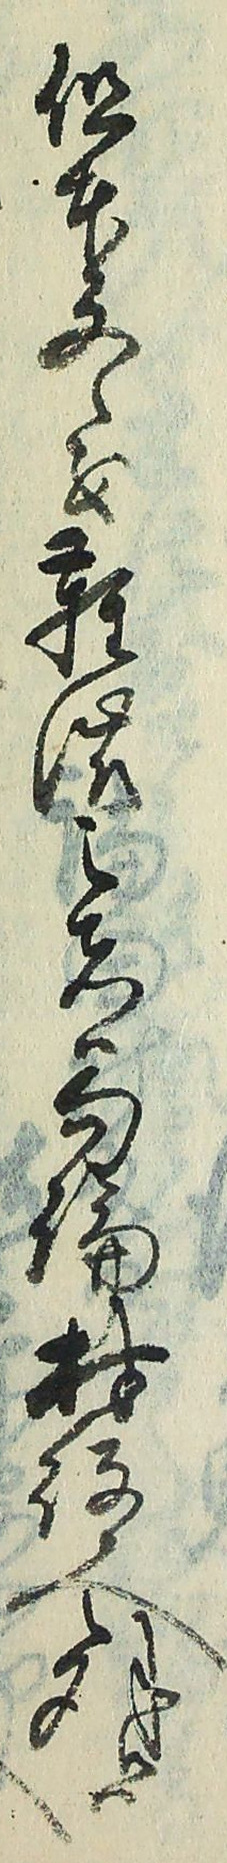但本文之義難渋之者ハ勿論村役人之外江ハ
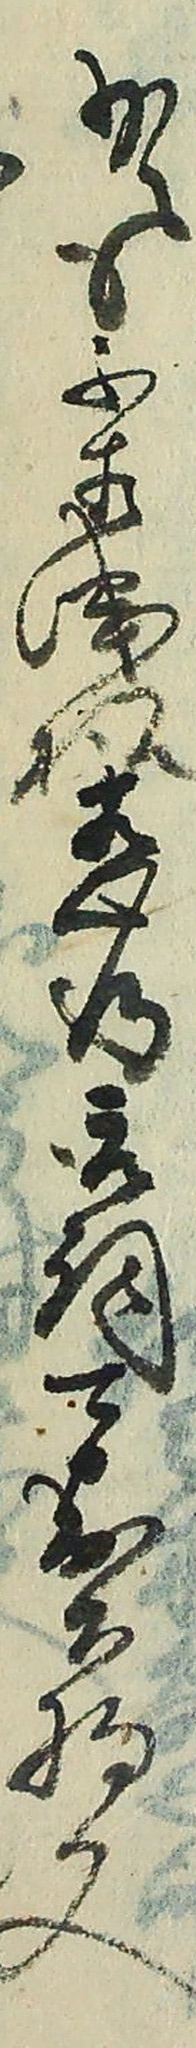少しも不相洩様相心得取調可申出候将又
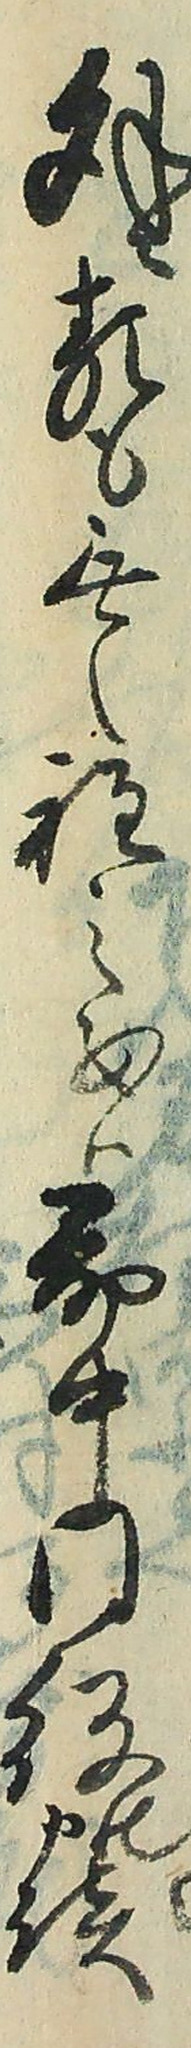外ニ類も無之程之義ハ郡中同役共申談
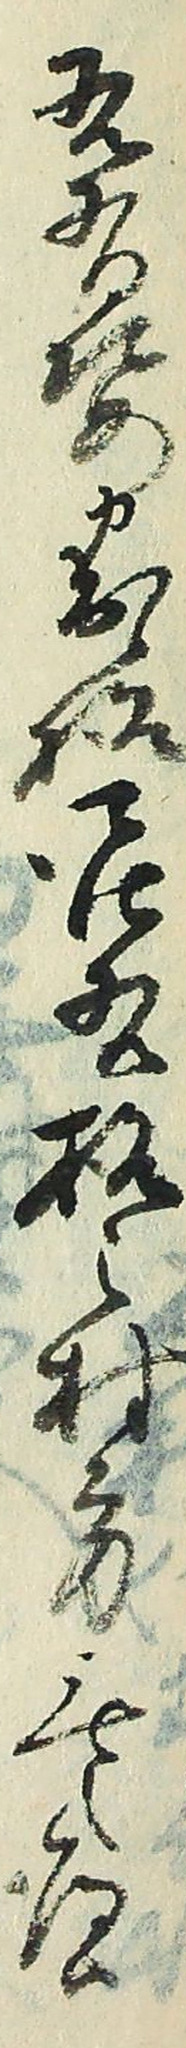右有姿申出候様可仕右様之村方無之候得ハ
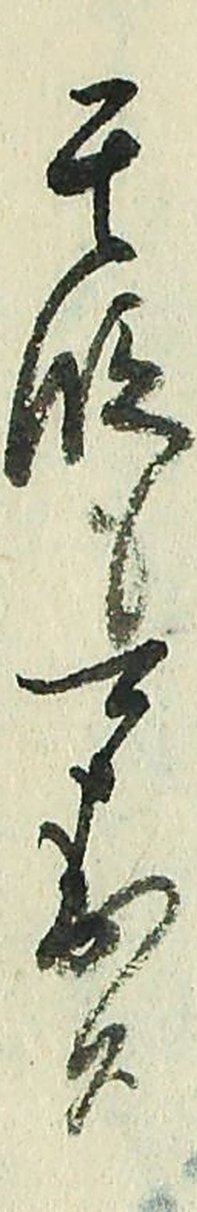其段も可申出候
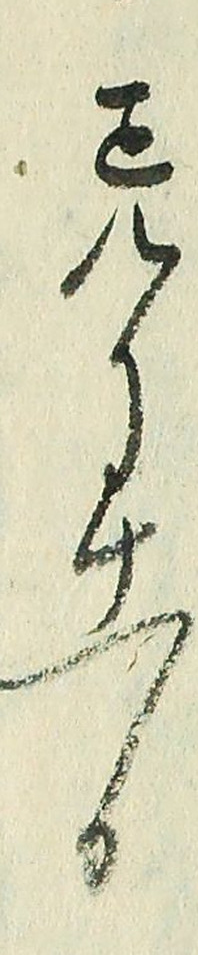巳八月十一日

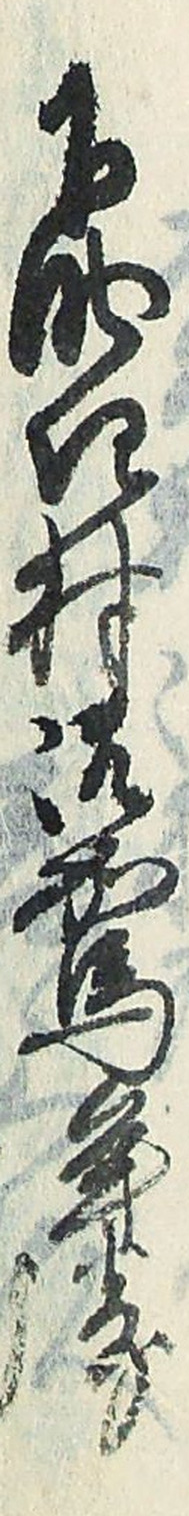下助任村御駕年寄
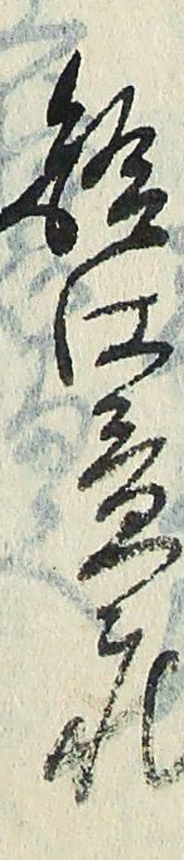鈴江益蔵
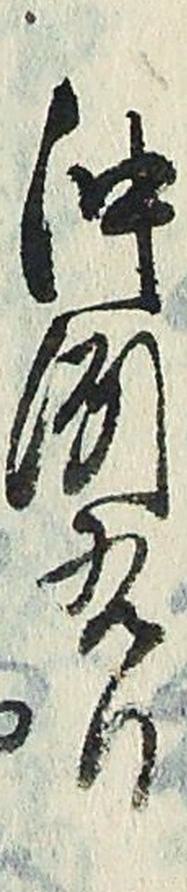沖洲右同
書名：諸御趣意書并御下知向之写
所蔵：鳴門教育大学 Naruto University of Education
